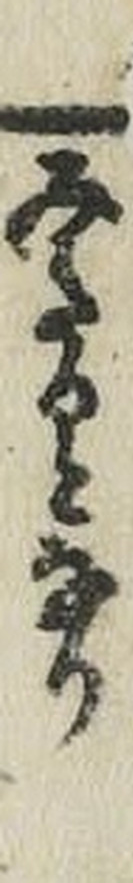みたるとなり
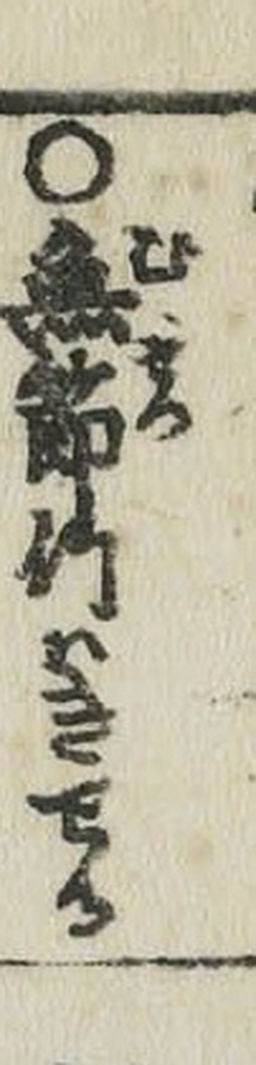○無節竹はきせる
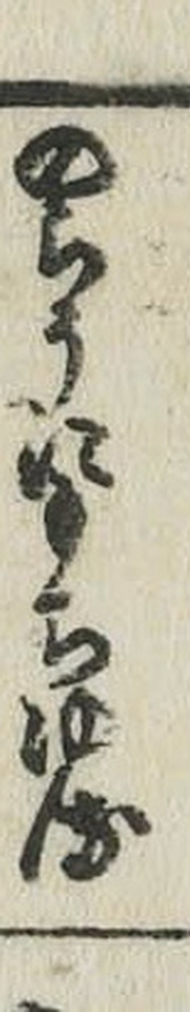のらうにもちゆる
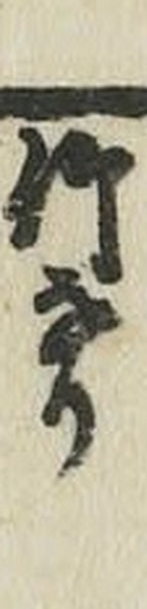竹なり
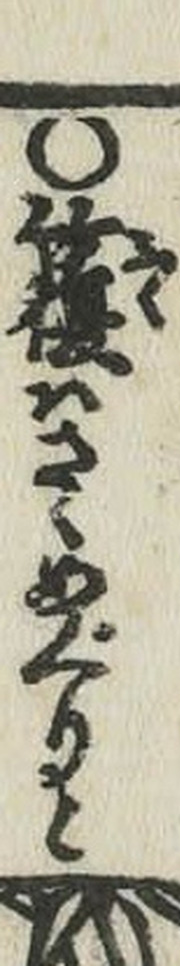○𥳇はさゝめぐりと
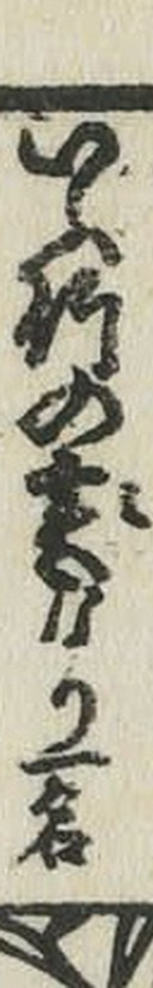いふ竹の実なり一名
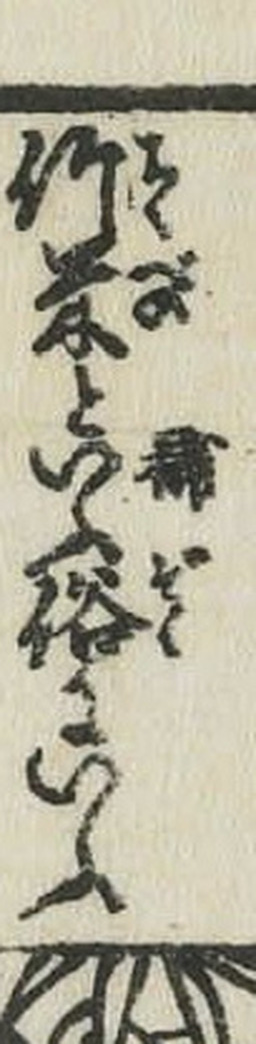竹米といふ俗にいふ
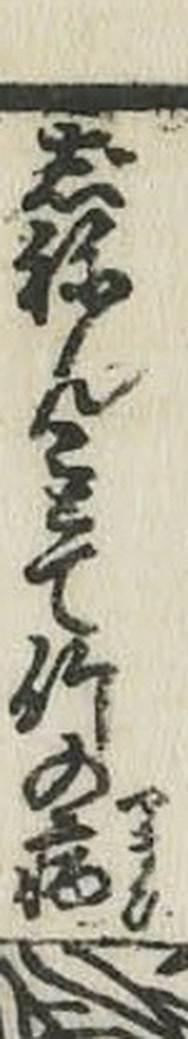じねんことて竹の病
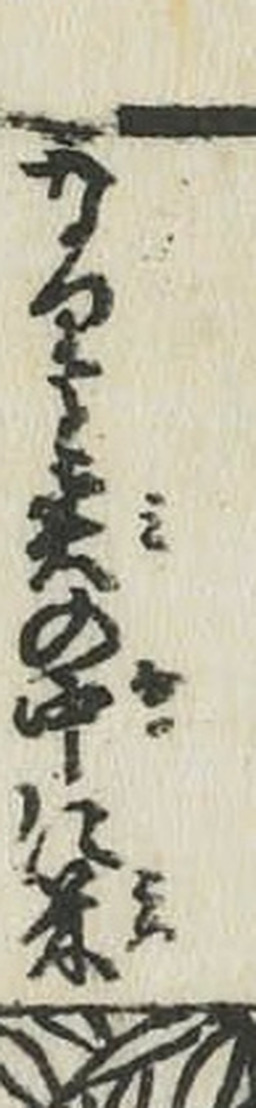なりと実の中に米
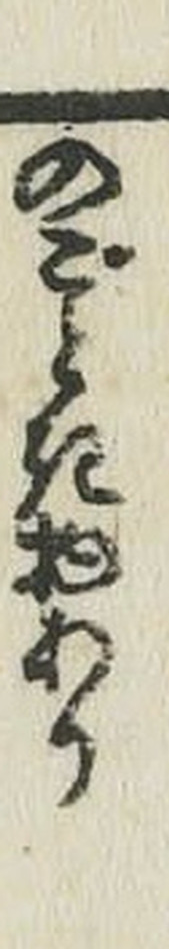のごとき物あり
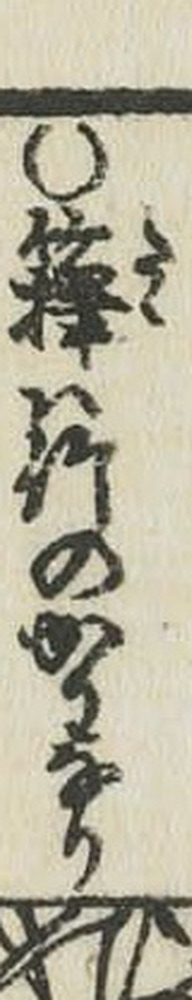○籜は竹のかわなり
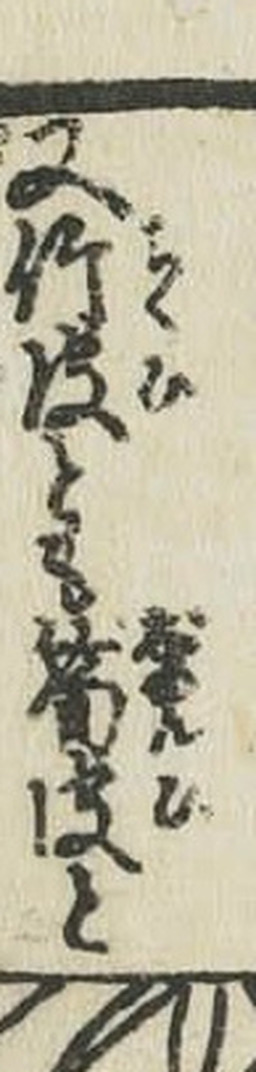又竹皮とも筍皮と
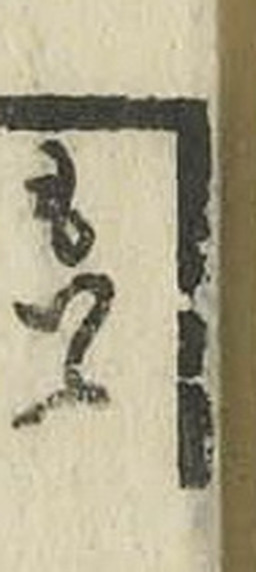もいふ
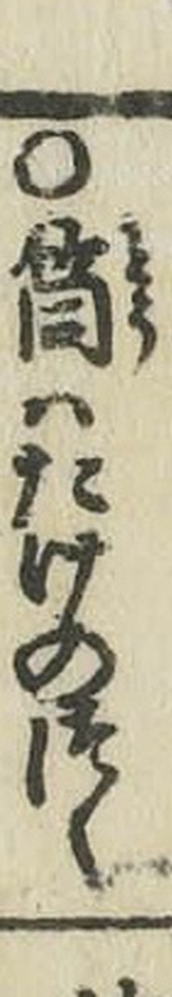○筒はたけのつゝ
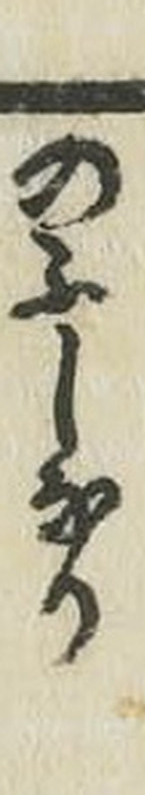のふしなり
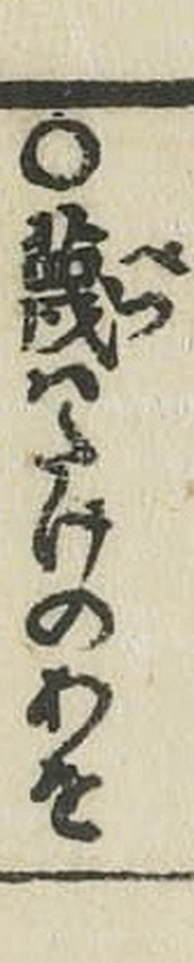○蔑はたけのあを
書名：増補頭書訓蒙図彙大成 10巻 8:巻之17-19
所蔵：東京学芸大学教育コンテンツアーカイブ
